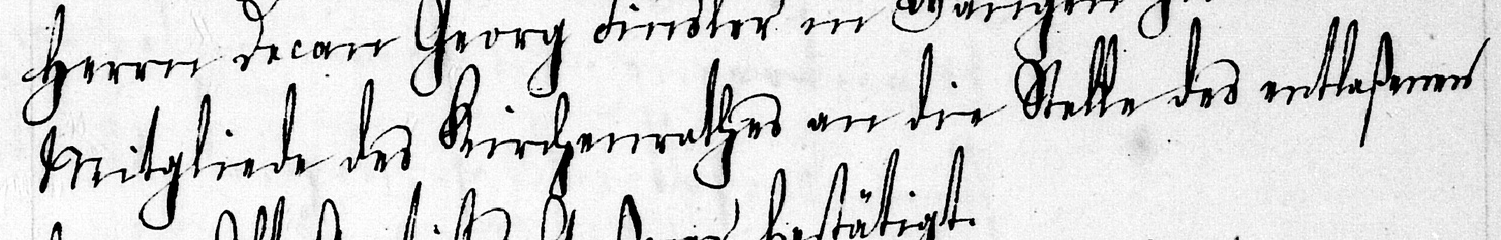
Mitgliede des Kirchenrathes an die Stelle des entlaßenen
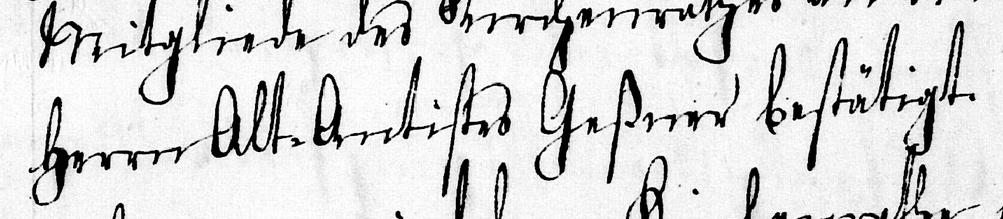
Herrn Alt-Antistes Geßner bestätigt.
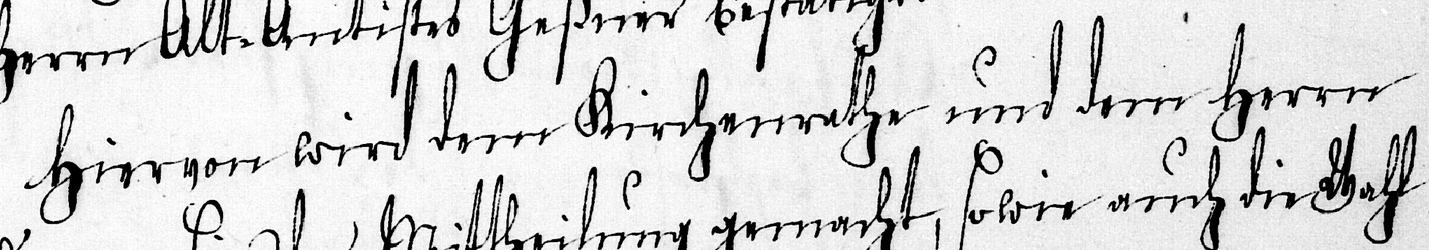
Hiervon wird dem Kirchenrathe und dem Herrn
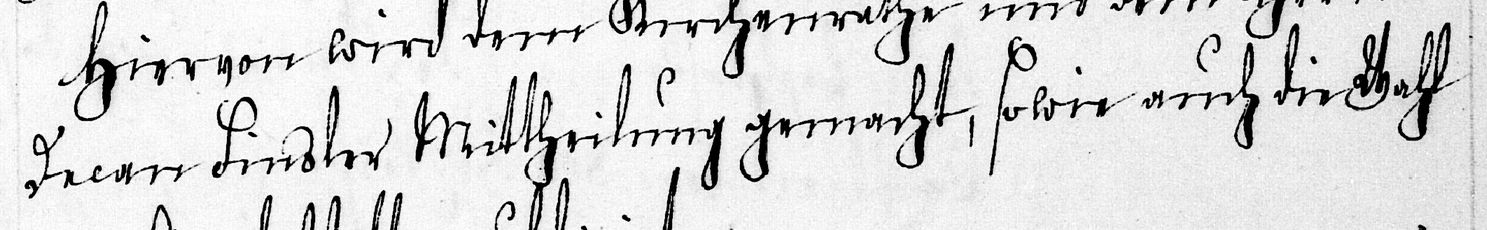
Decan Finsler Mittheilung gemacht, sowie auch die Wahl
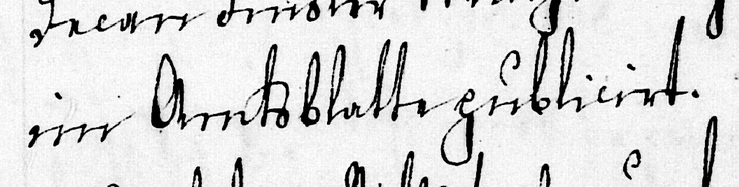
im Amtsblatte publicirt.
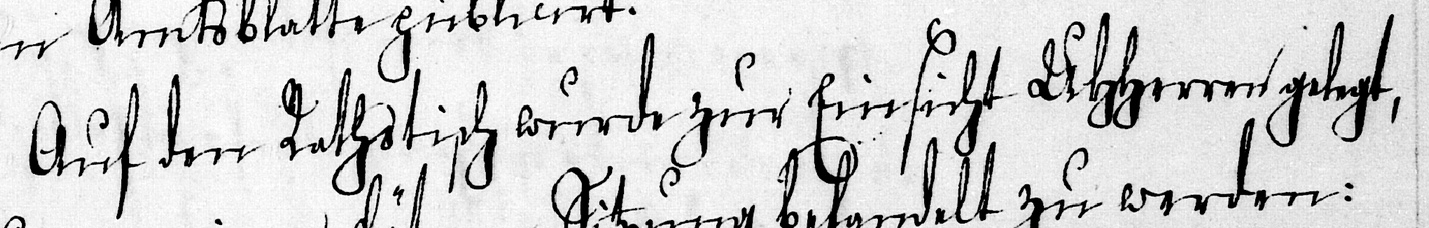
Auf den Rathstisch wurde zur Einsicht UHHerren gelegt,
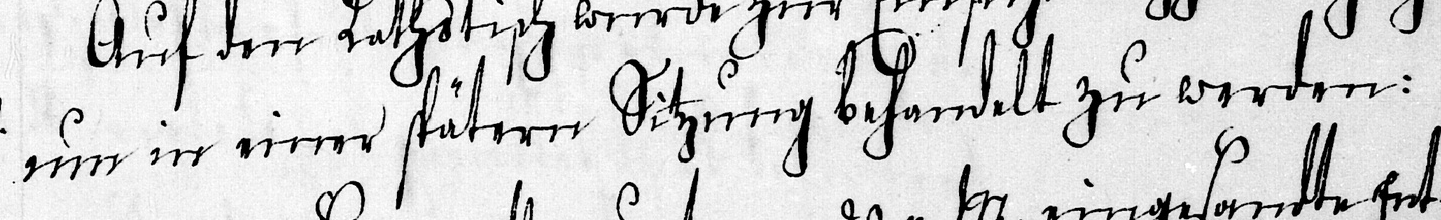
um in einer spätern Sitzung behandelt zu werden:
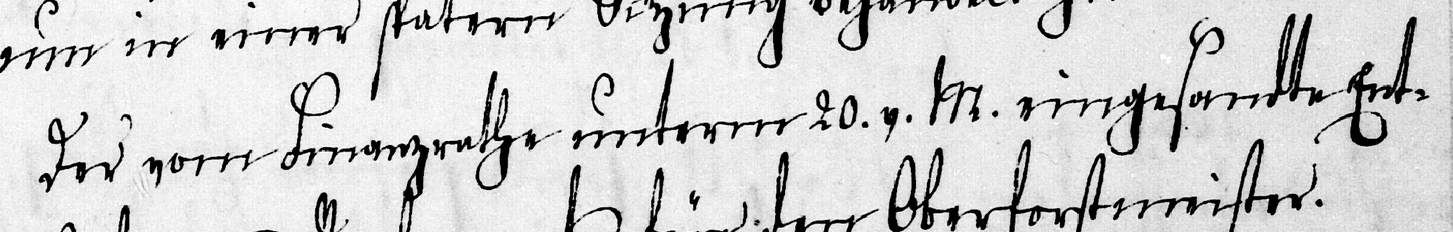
Der vom Finanzrathe unterm 20. v. M. eingesandte Ent¬
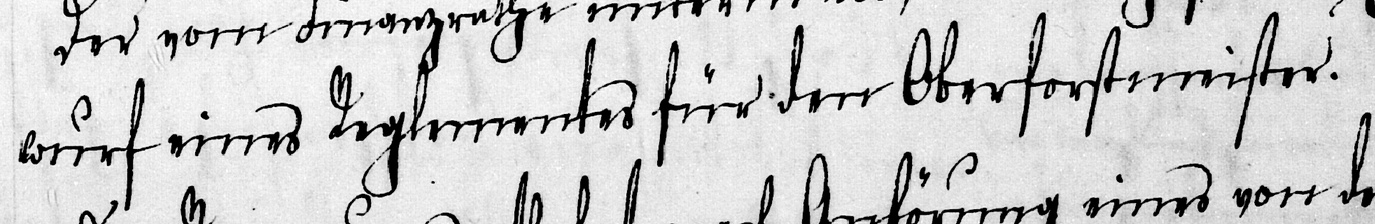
wurf eines Reglementes für den Oberforstmeister.
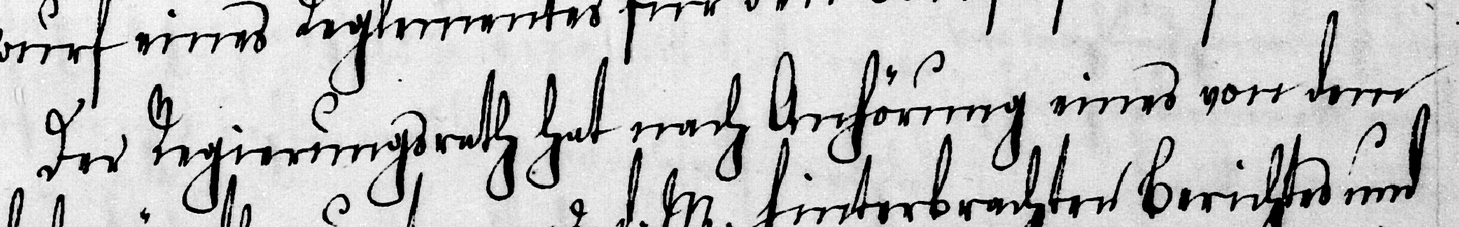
Der Regierungsrath hat nach Anhörung eines von dem
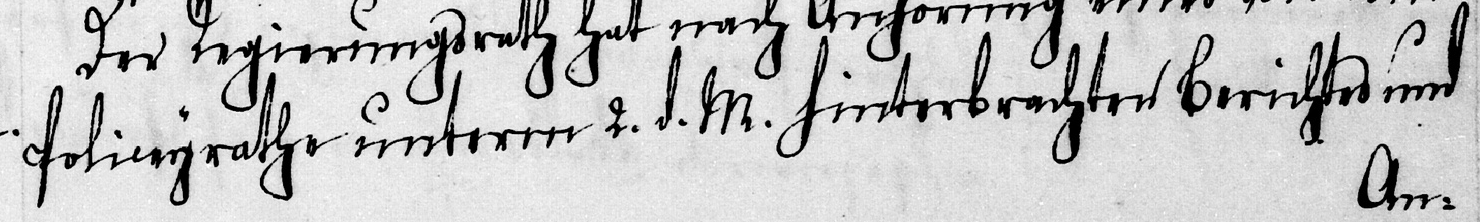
Policeyrathe unterm 2. d. M. hinterbrachten Berichtes und
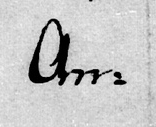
An-
